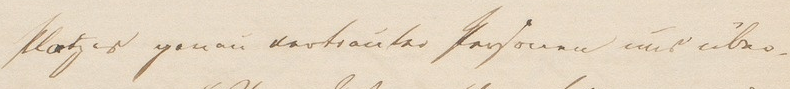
Platzes genau vertrauter Personen uns über-
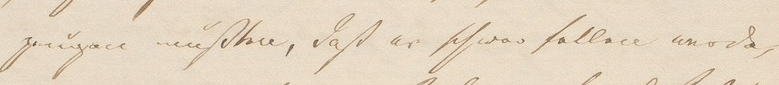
zeugen mußten, daß es schwer fallen werde,
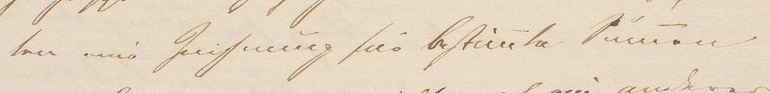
ten eine Zeichnung für bestimmte Summen
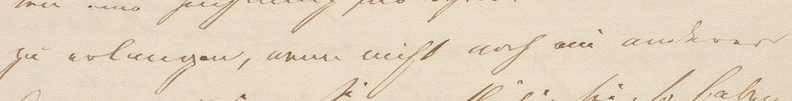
zu erlangen, wenn nicht noch ein anderer
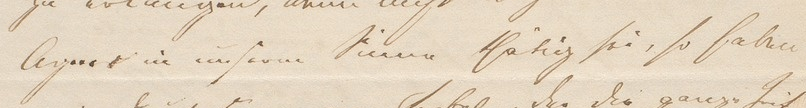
Agent in unserm Sinne thätig sei, so haben
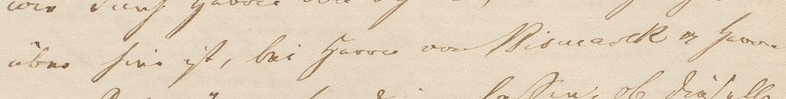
über hier ist, bei Herrn von Bismarck & Herrn
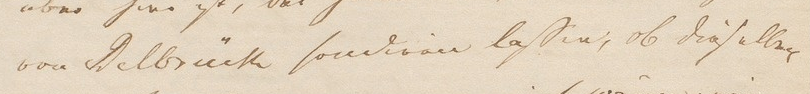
von Delbrück sondiren laßen, ob dieselben
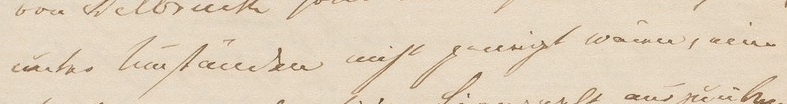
unter Umständen nicht geneigt wären, eine
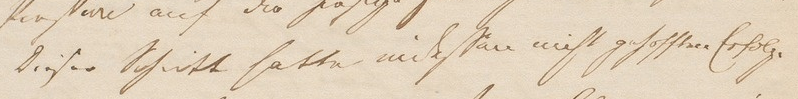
Dieser Schritt hatte ... nicht gehofften Erfolg.
